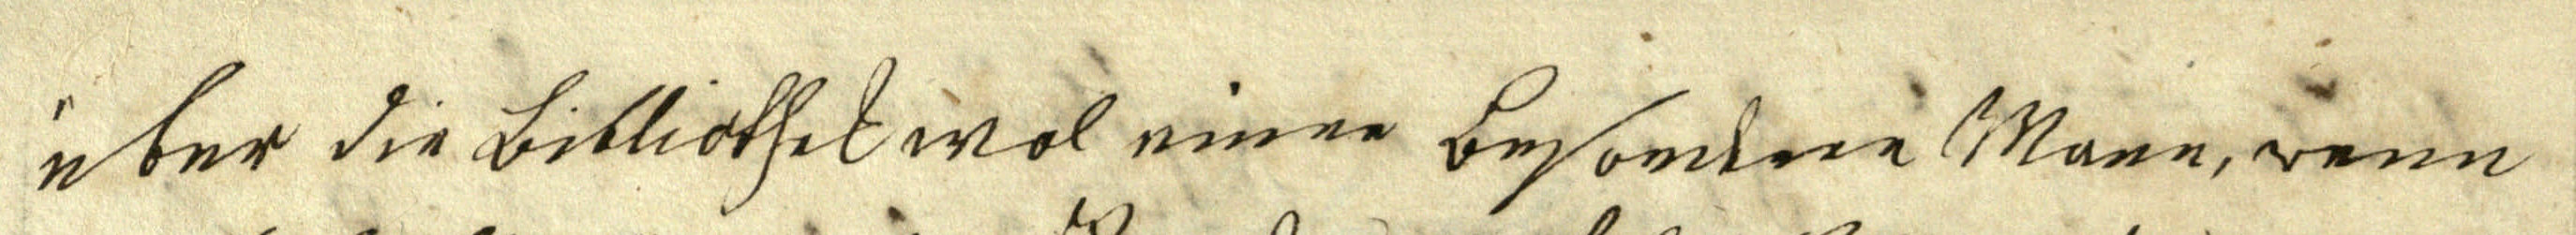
über die Bibliothek wol einen besonderen Mann, wenn
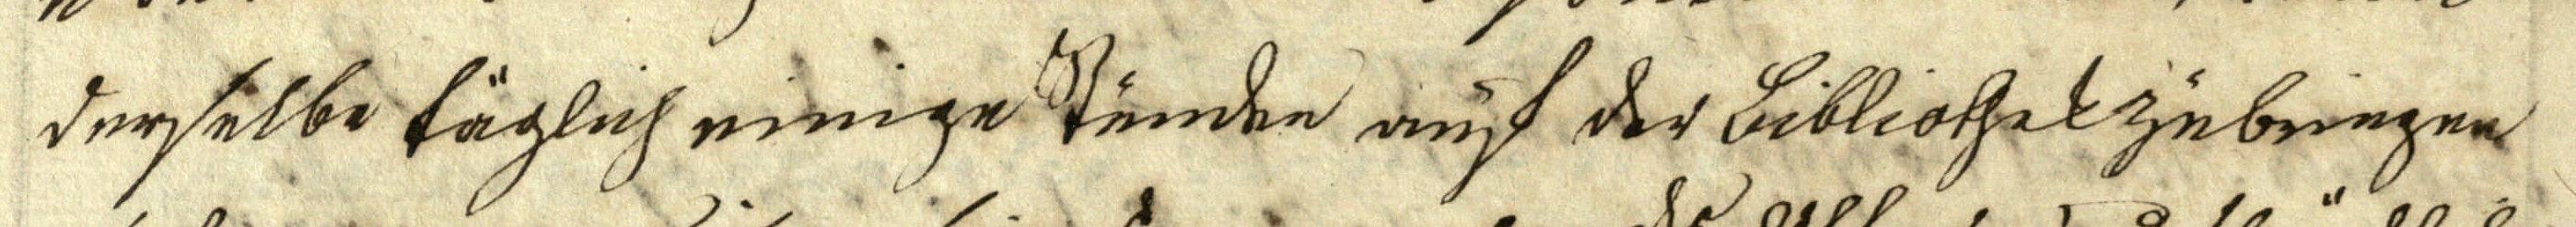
derselbe täglich einige Stunden auf der Bibliothek zubringen
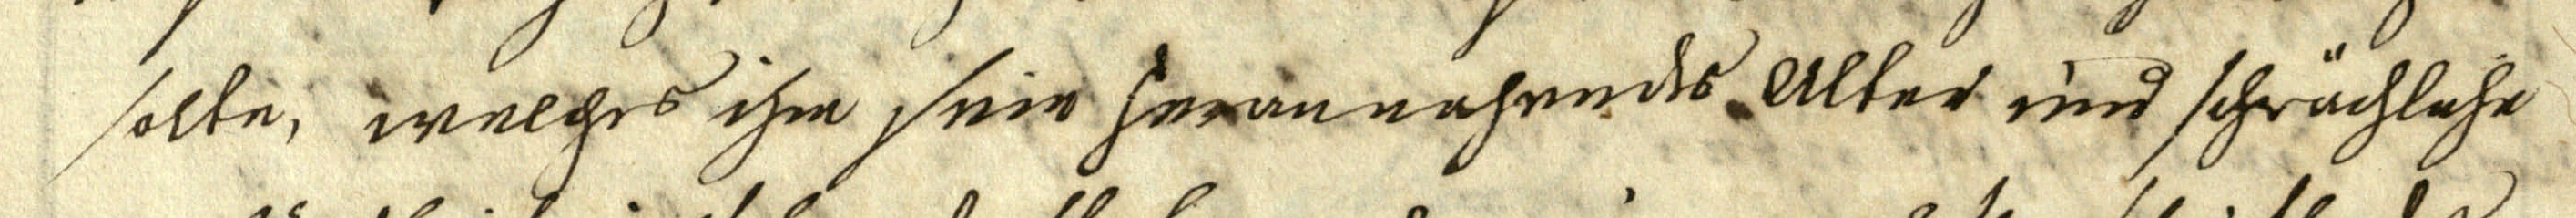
solte, welches ihm sein herannahendes Alter und schwächliche
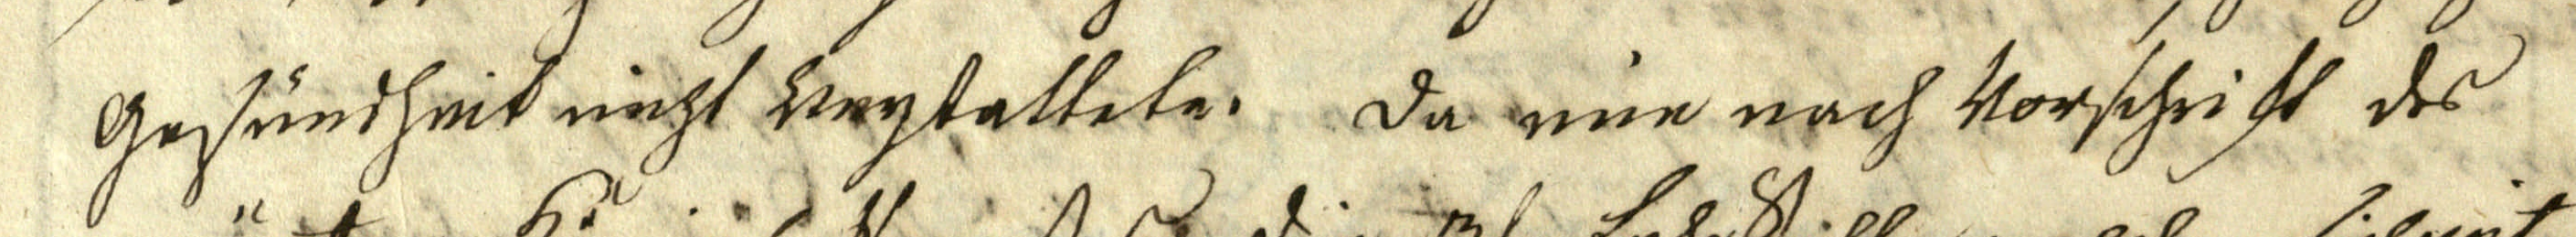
Gesundheit nicht verstattete. Da nun nach Vorschrift des
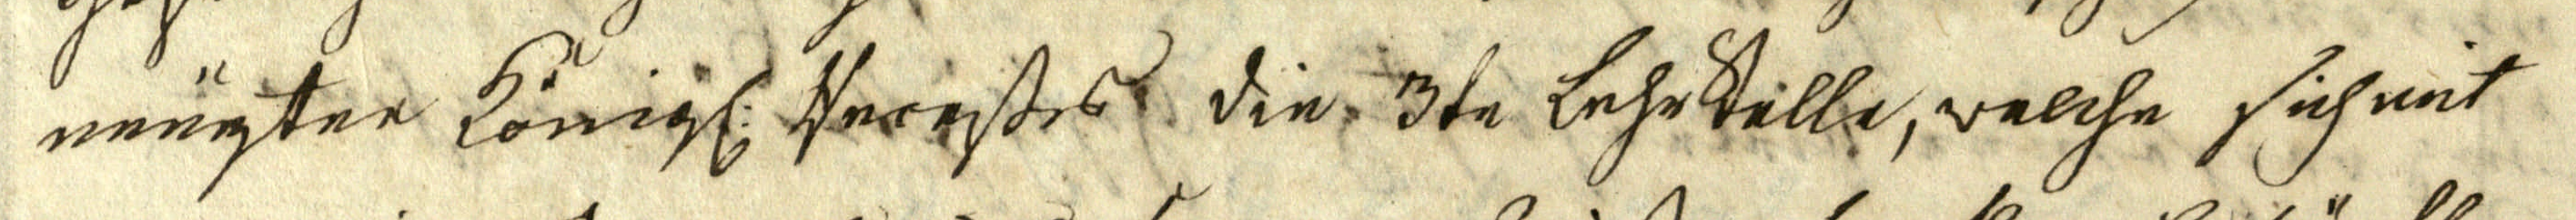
neuesten Königl. Receßes die 3te LehrStelle, welche sich mit
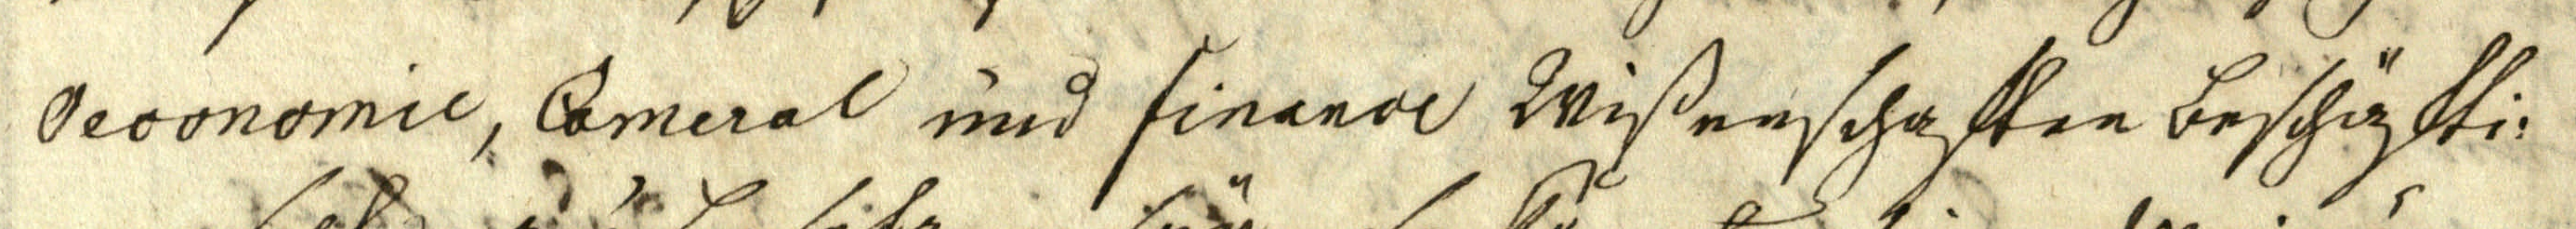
Oeconomie, Cameral und Finance Wissenschaften beschäfti¬
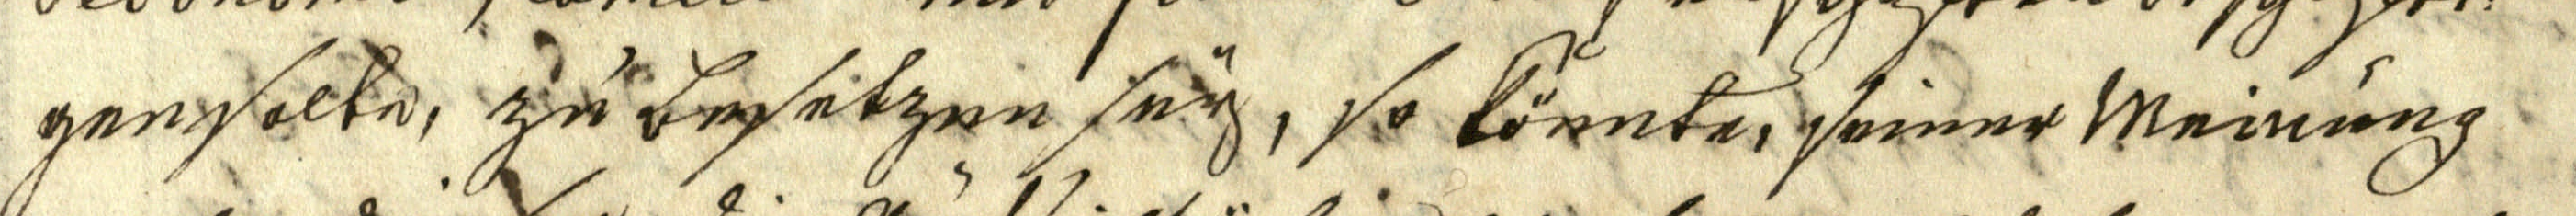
gen solte, zu besetzen seÿ, so könnte, seiner Meinung
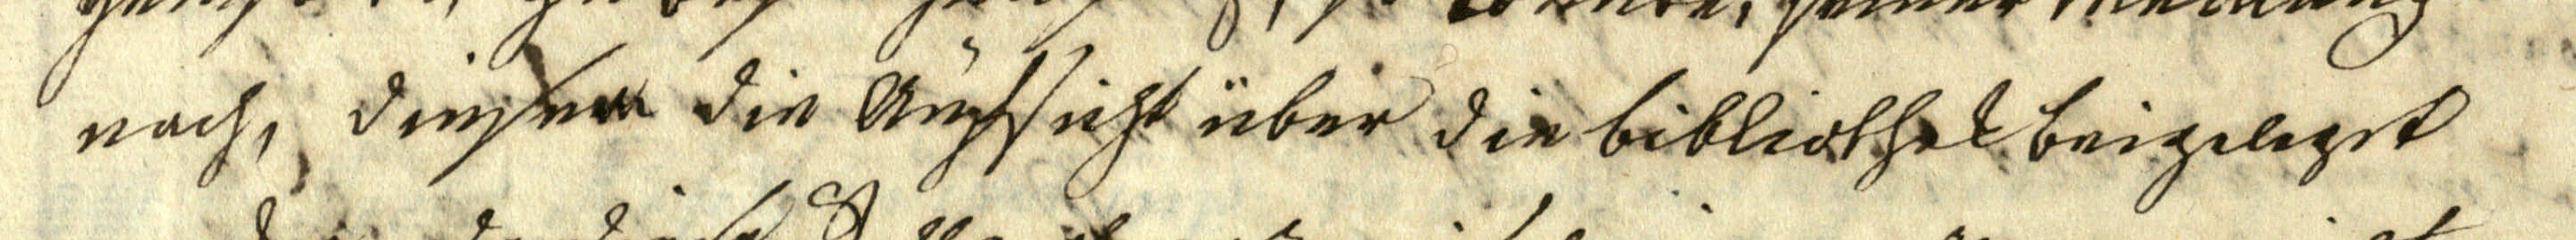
nach, diesem die Aufsicht über die Bibliothek beigeleget
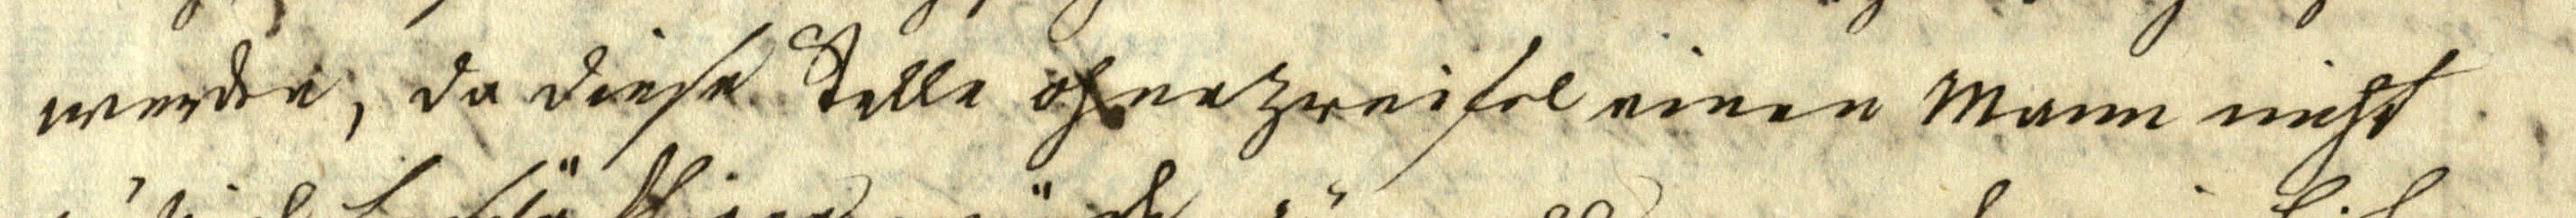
werden, da diese Stelle ohne Zweifel einen Mann nicht
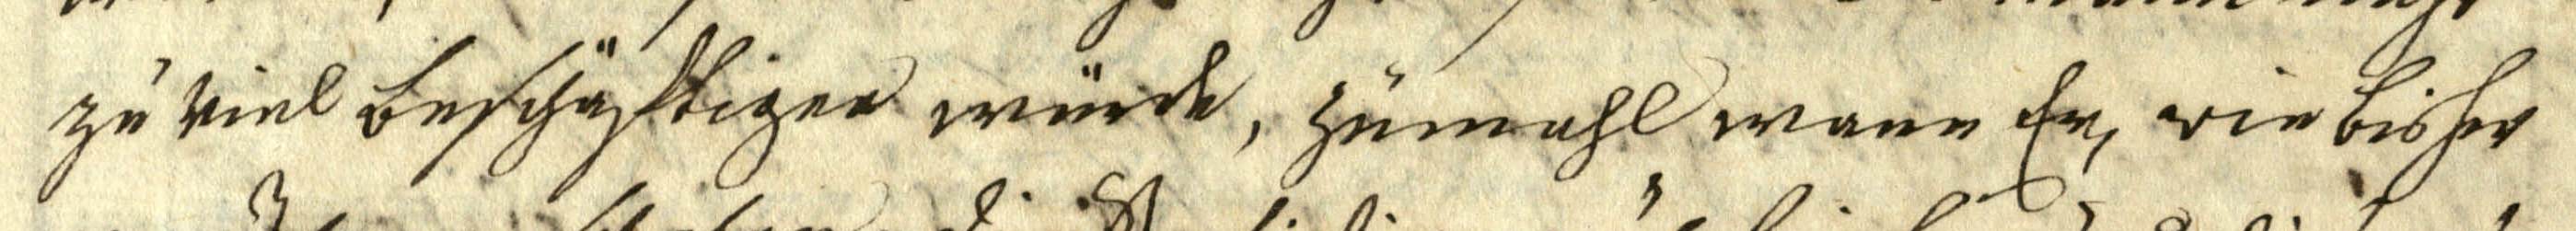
zu viel beschäftigen würde, zumahl wann Er, wie bisher
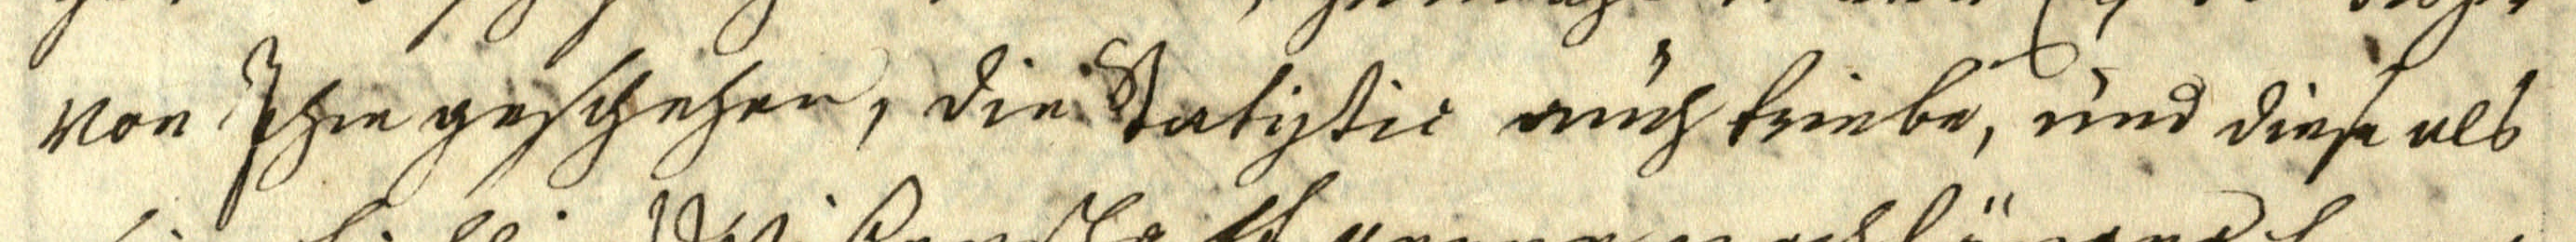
von Ihm geschehen, die Statistic auch triebe, und diese als
